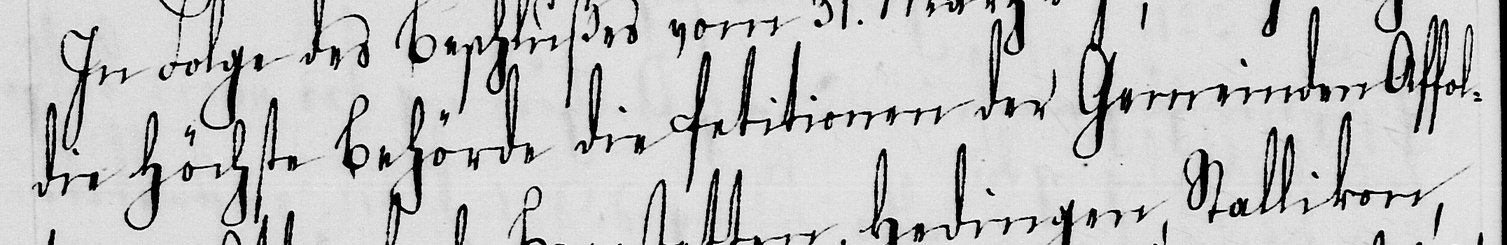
die höchste Behörde die Petitionen der Gemeinden Af¬
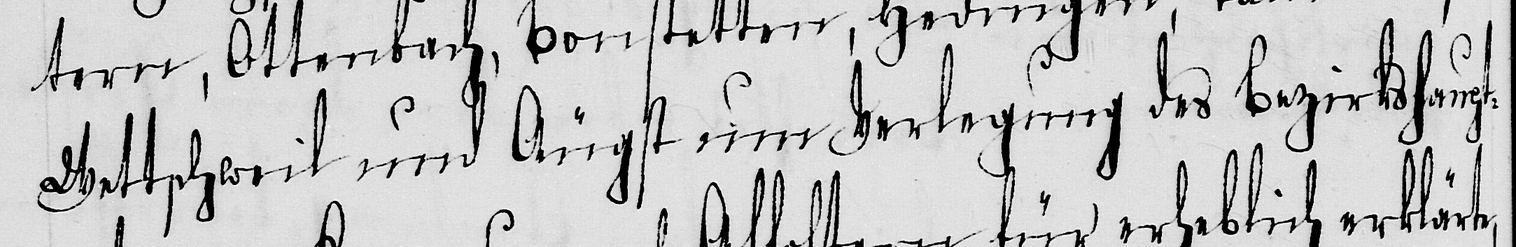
Wettschweil und Äugst um Verlegung des Bezirkshaup¬
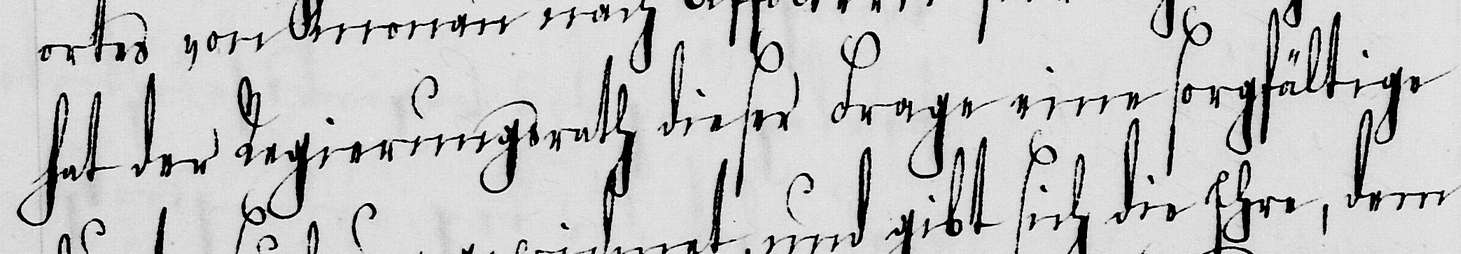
hat der Regierungsrath dieser Frage eine sorgfältige
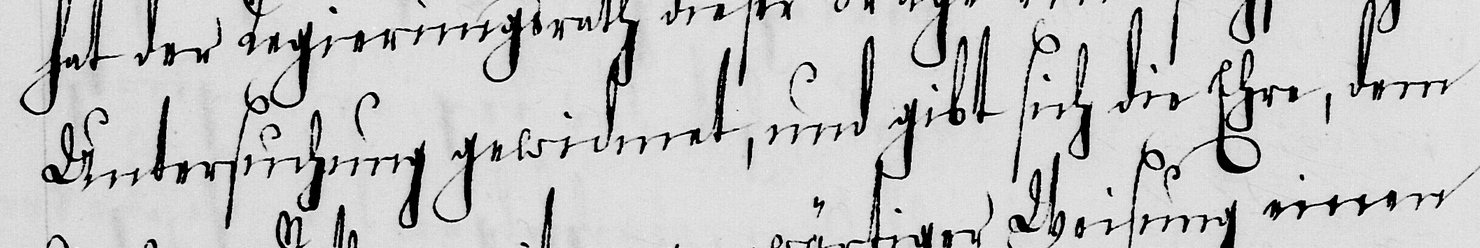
Untersuchung gewidmet, und gibt sich die Ehre, dem
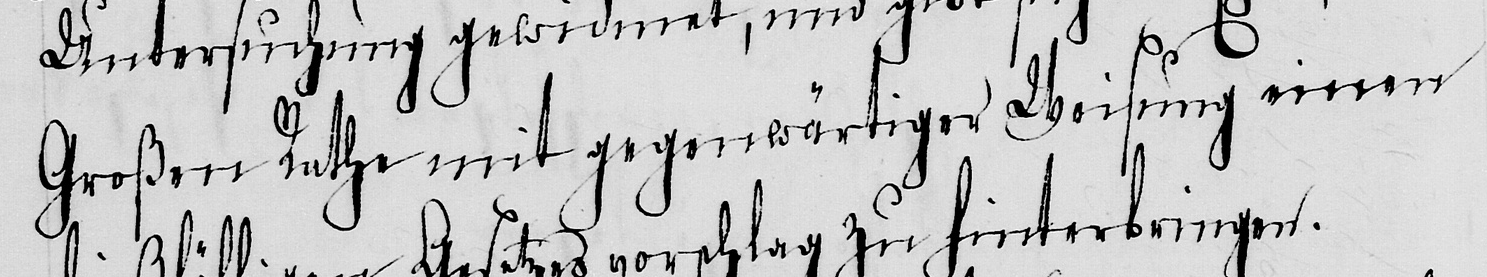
Großen Rathe mit gegenwärtiger Weisung einen
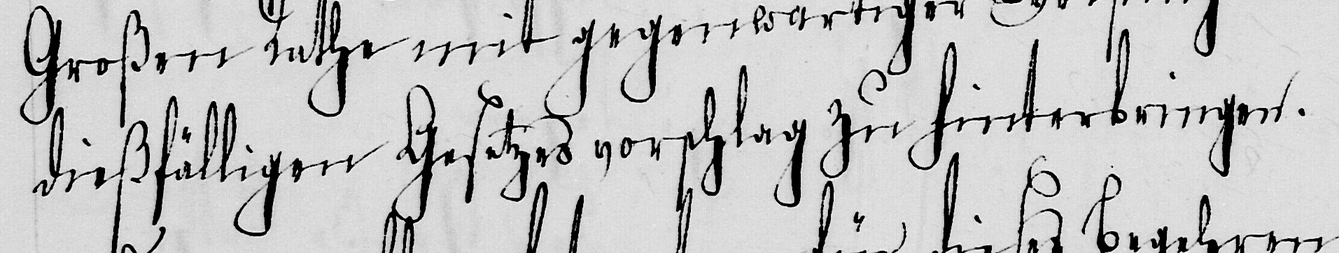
dießfälligen Gesetzesvorschlag zu hinterbringen.
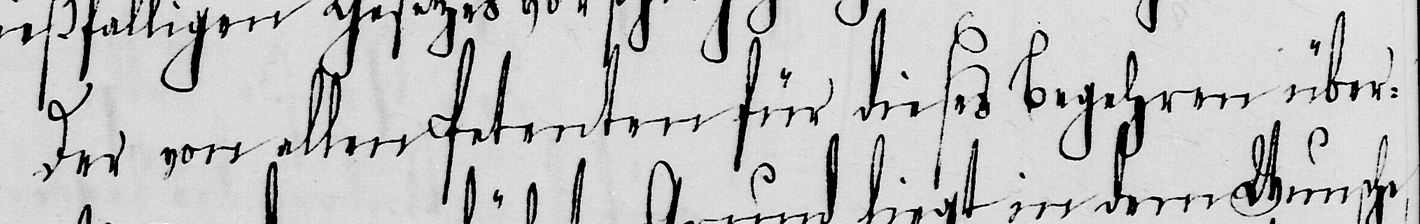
Der von allen Petenten für dieses Begehren über¬
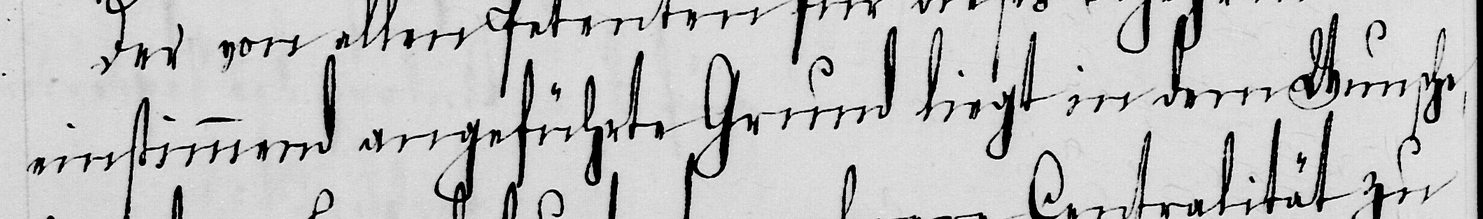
einstimmend angeführte Grund liegt in dem Wunsche,
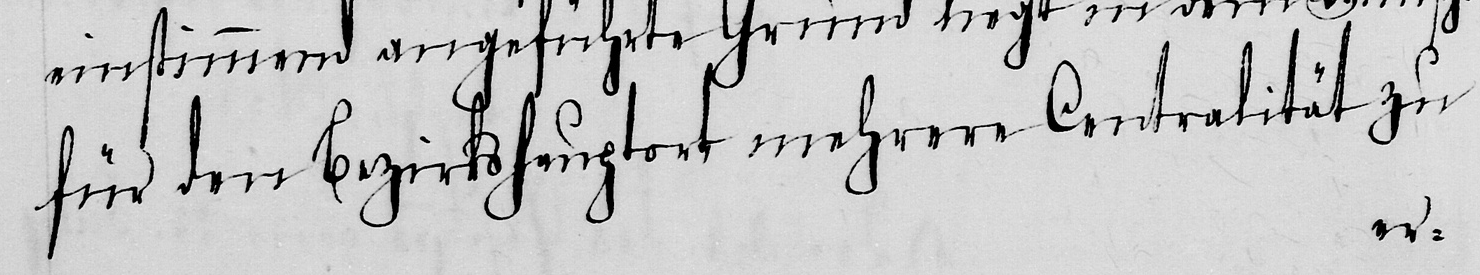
für den Bezirkshauptort mehrere Centralität zu
